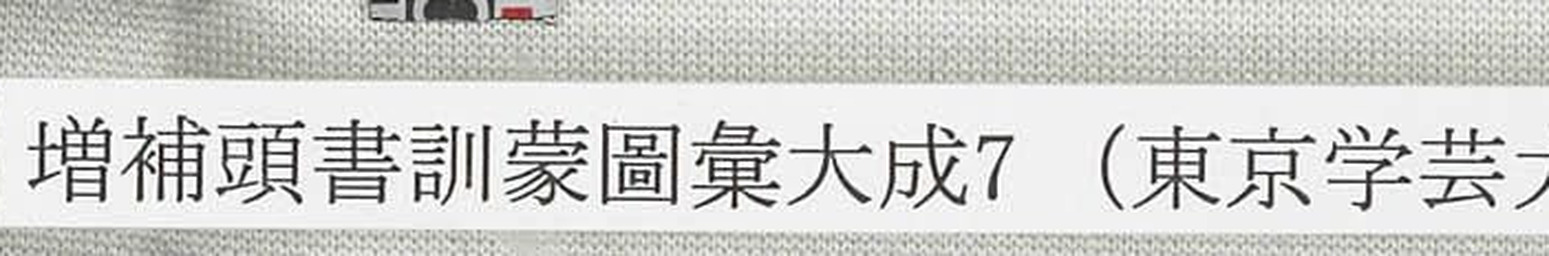増補頭書訓蒙図彙大成七

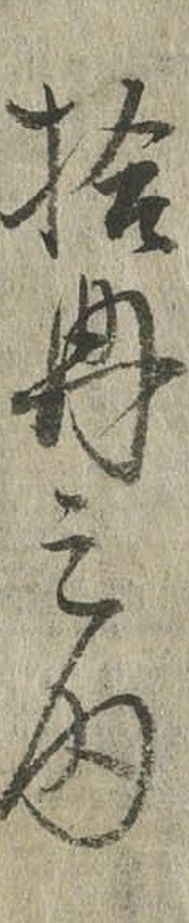拾冊之内
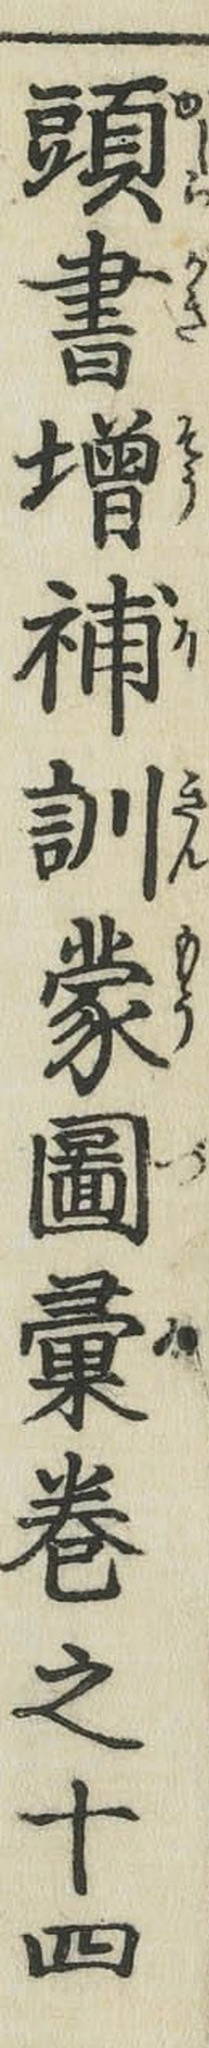頭書増補訓蒙図彙巻之十四
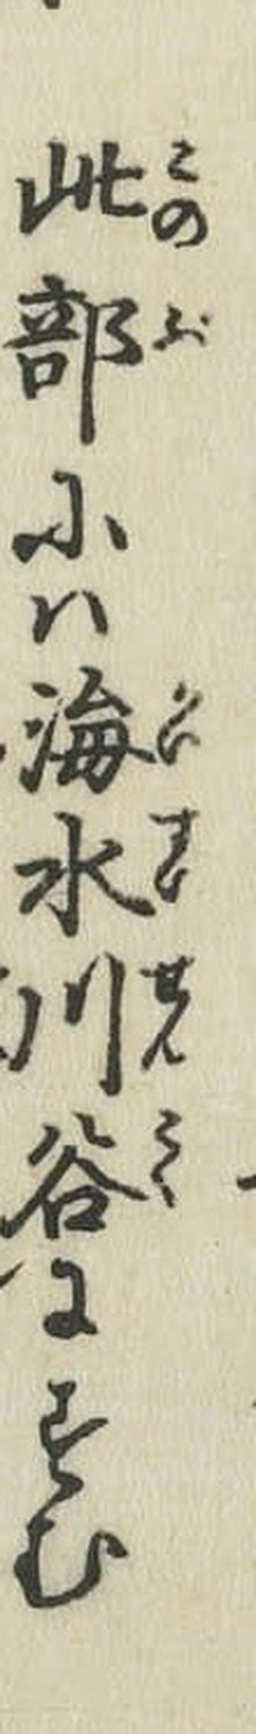此部には海水川谷にすむ
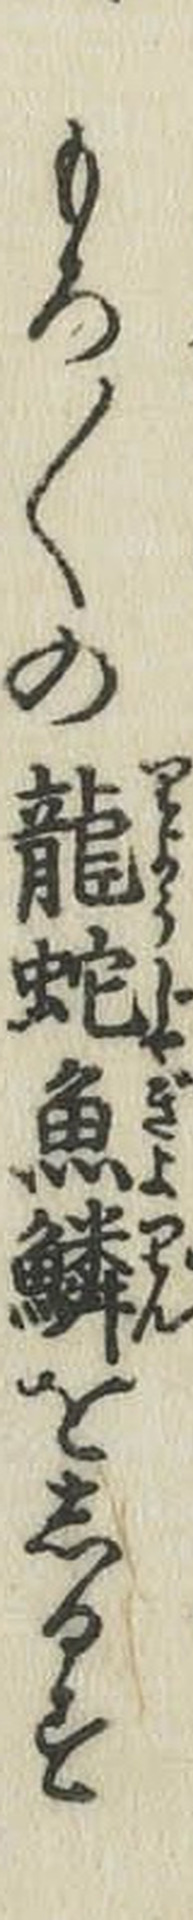もろ〳〵の龍蛇魚鱗をしるす
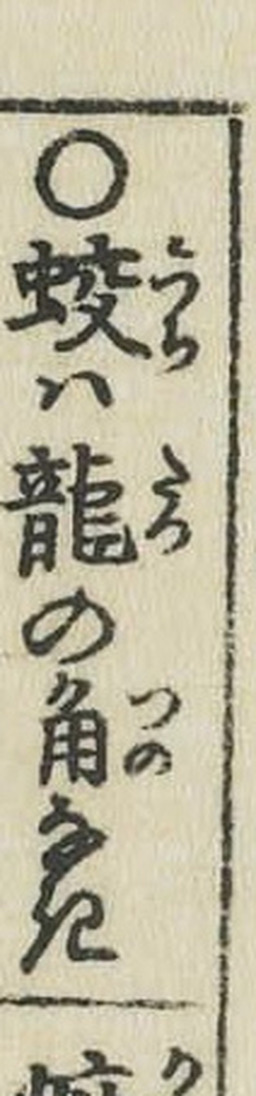○蛟は龍の角なき
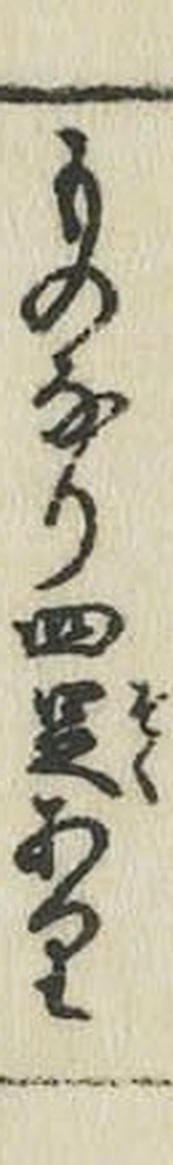ものなり四足あり
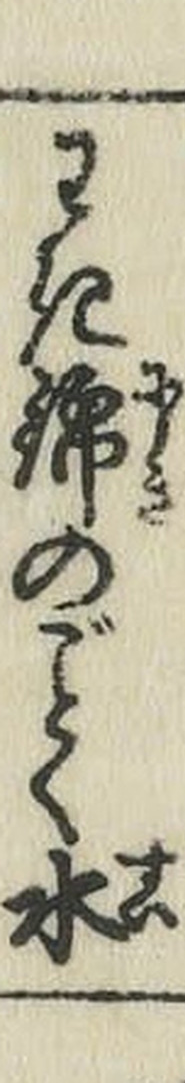わき錦のごとく水
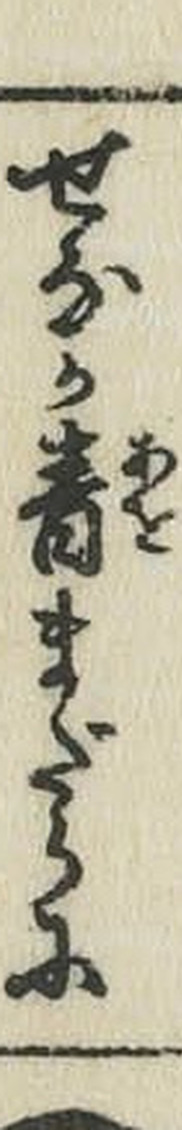せなか青まだらに
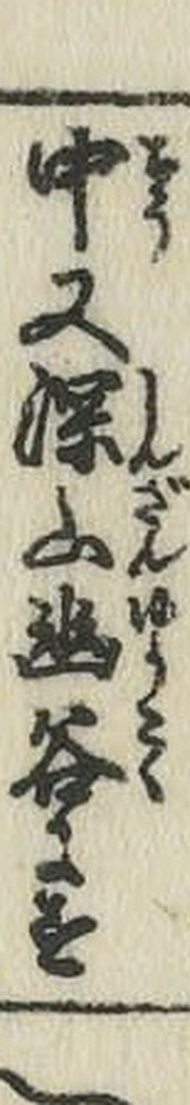中又深山幽谷にす
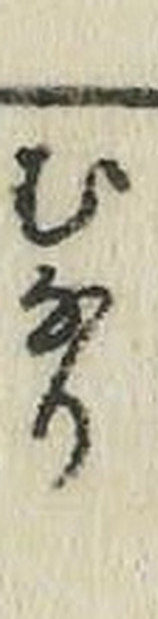むなり
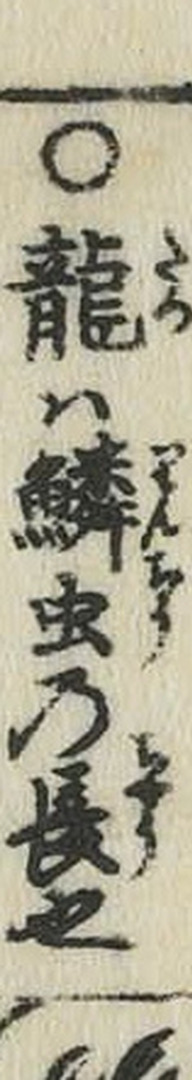○龍は鱗虫の長也
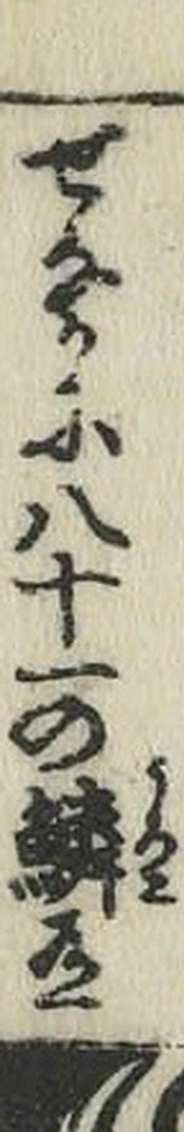せなかに八十一の鱗有
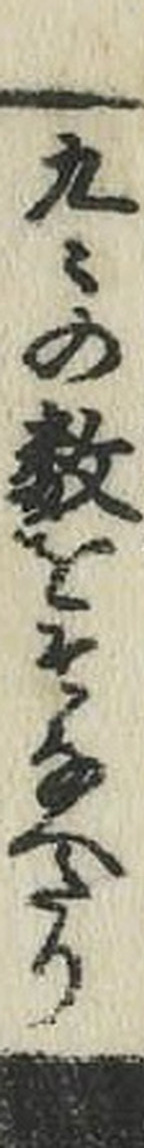九々の数をそなへたり
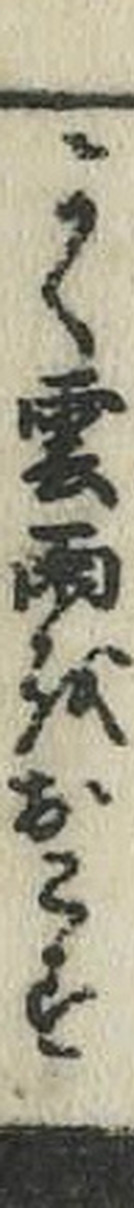よく雲雨をおこす

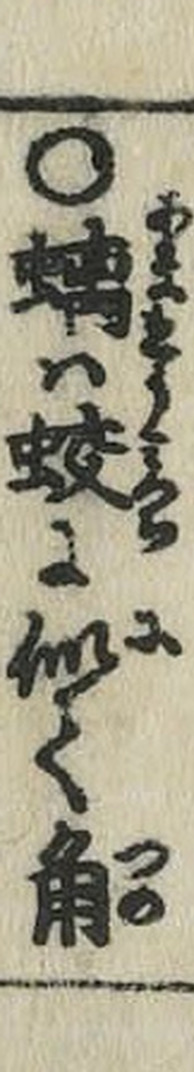○螭は蛟に似て角
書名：増補頭書訓蒙図彙大成 10巻 7:巻之14-16
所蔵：東京学芸大学教育コンテンツアーカイブ
